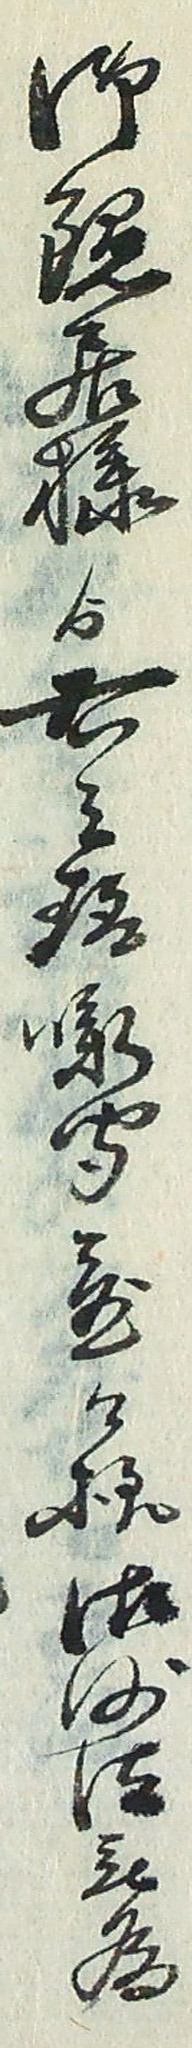御隠居様ゟ右之趣噺聞置候様御沙汰被為
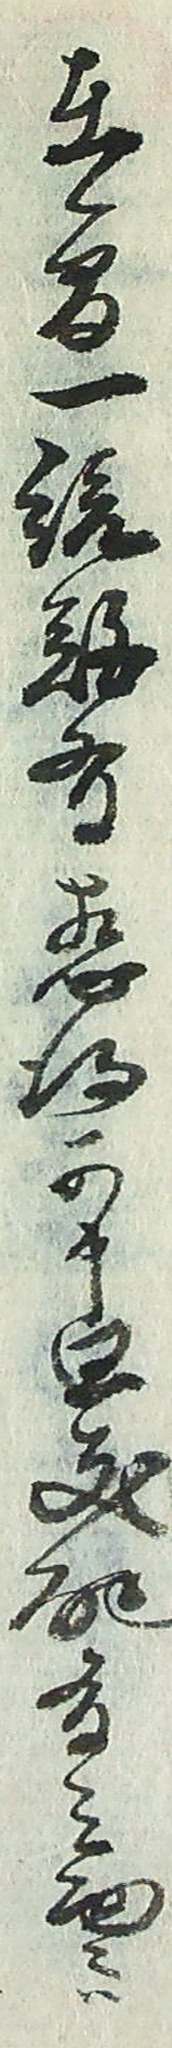在候間一統難有相心得可申且支配有之面々ハ
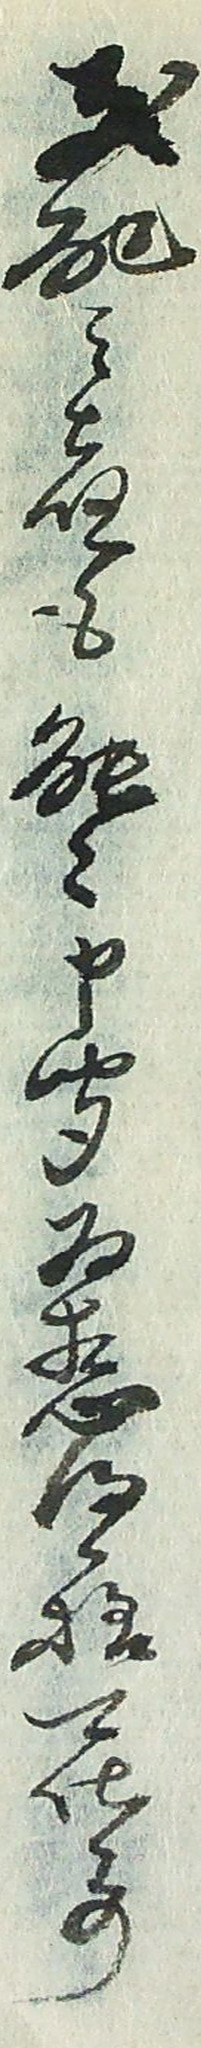支配之者へも能々申聞為相心得候様可仕候事
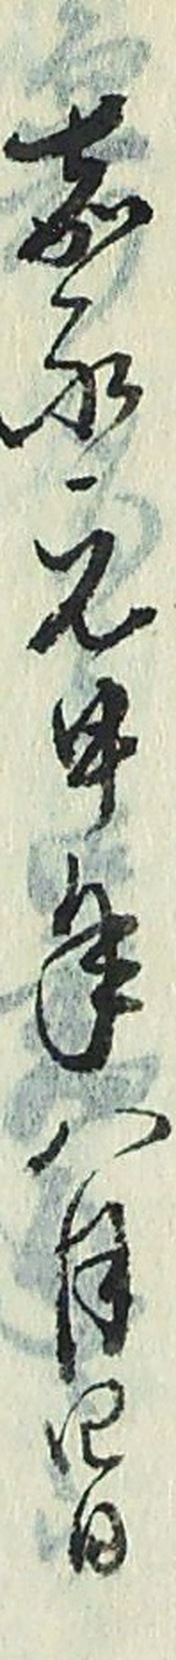嘉永元申年八月四日
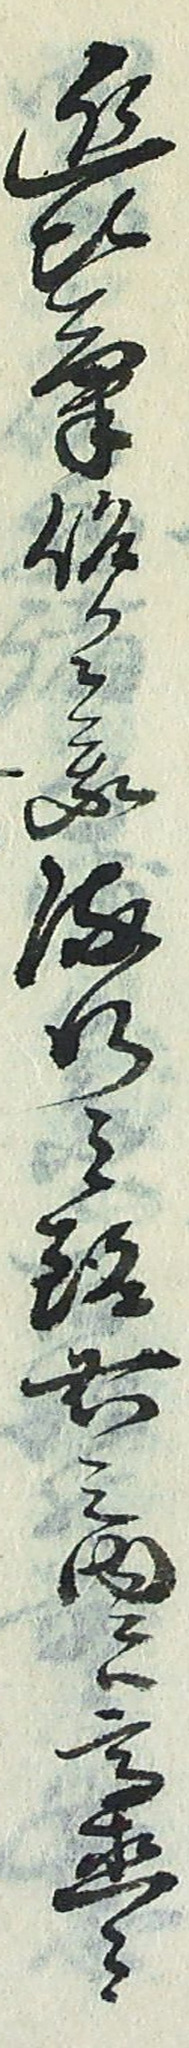近比菊作り之義流行之趣右之内ニハ高直之
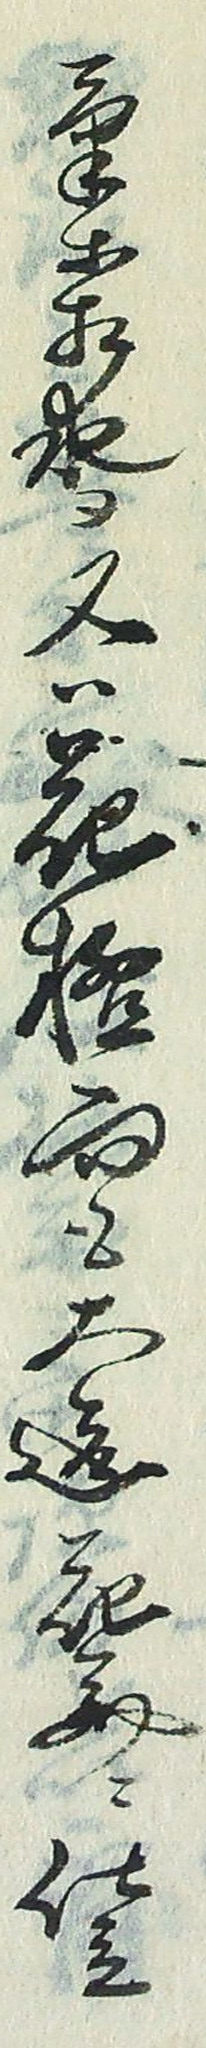菊等相求メ又ハ花檀向も大造花美ニ仕立
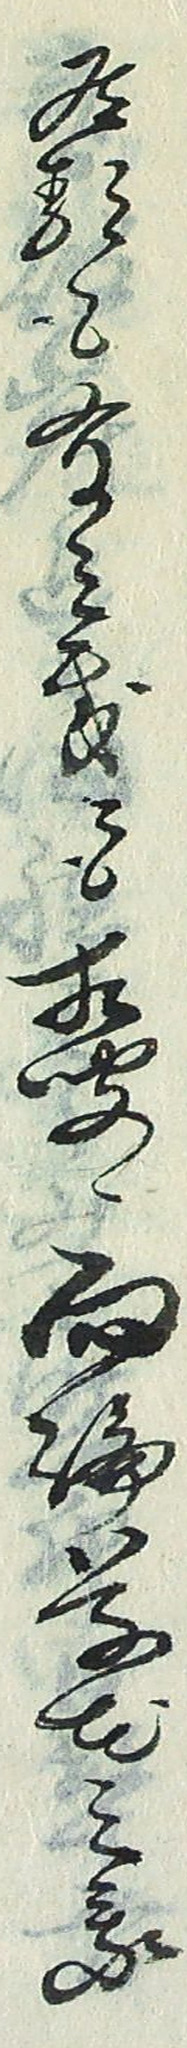候類も有之義ニも相聞候勿論草花之義
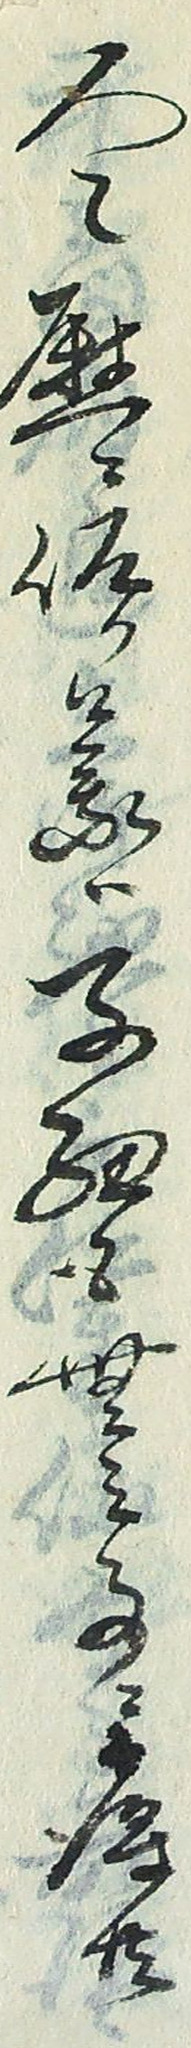人々慰ニ作り候義ハ子細も無之事ニ候得共
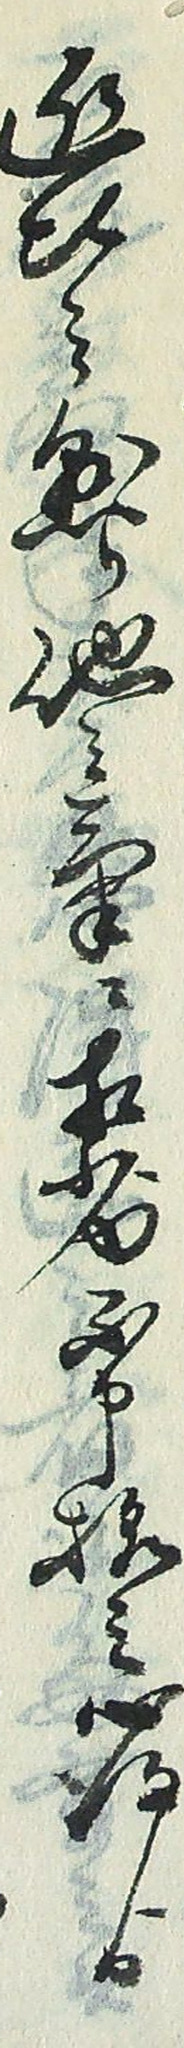近比之懸り他之菊ニ相劣不申様之心得ゟ
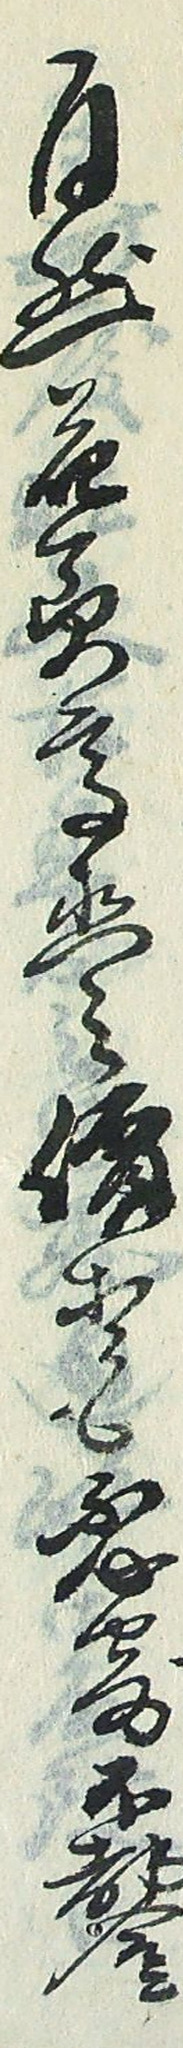自然花美高直之價等ニも不心寄不都合ニ
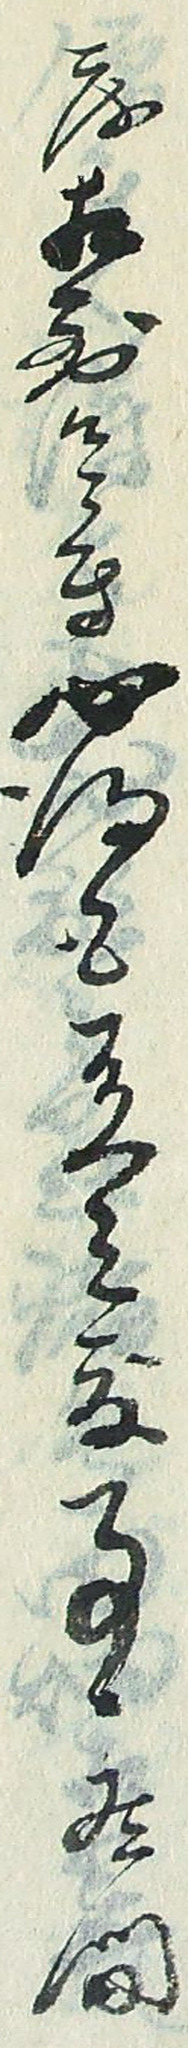も相到候ニ付心得も有之度事ニ候間

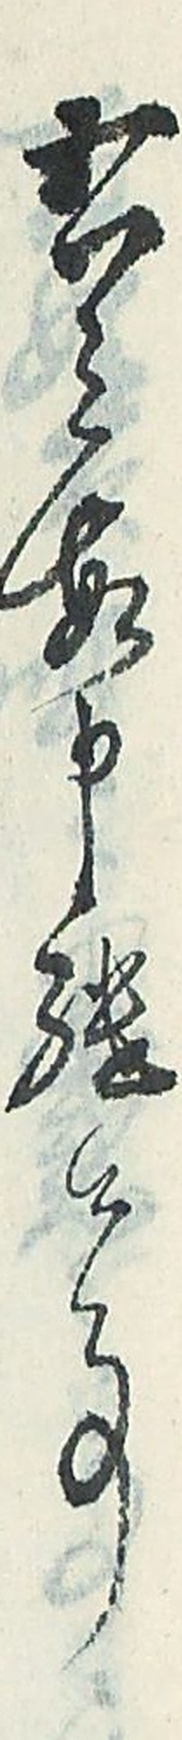右之段申継候事
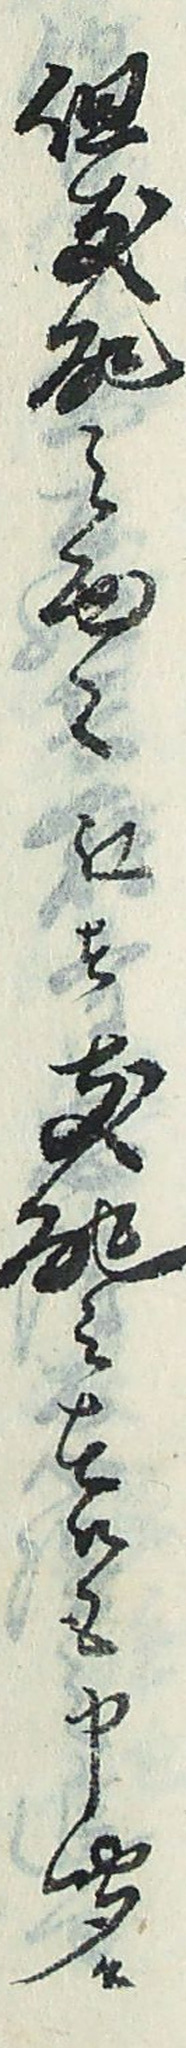但支配之面々江者支配之者江も申聞候
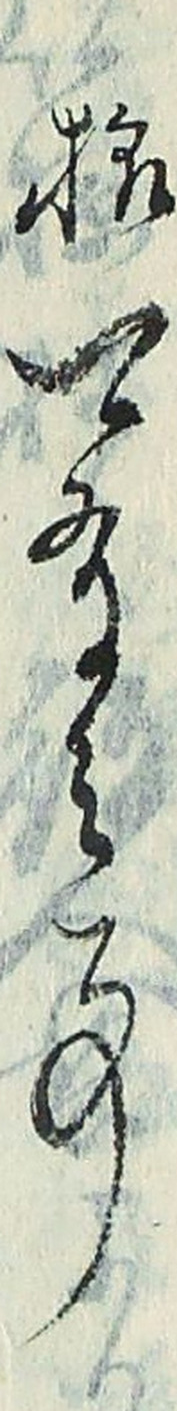様可有之事
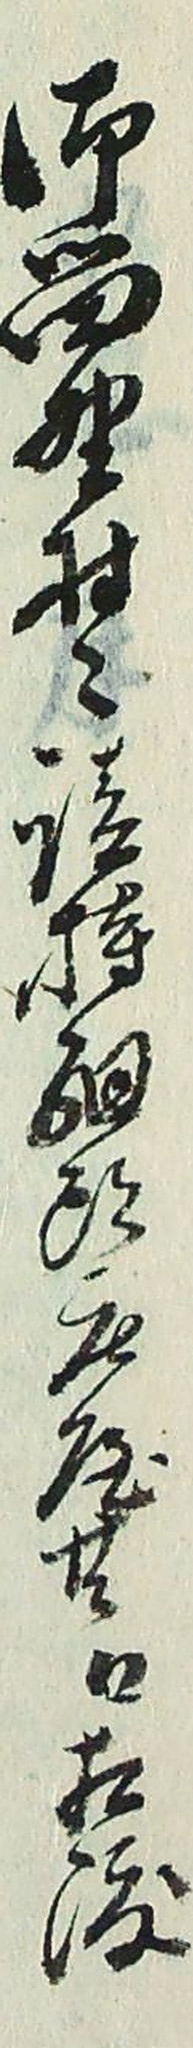御留野村々請持組頭庄屋共江相渡
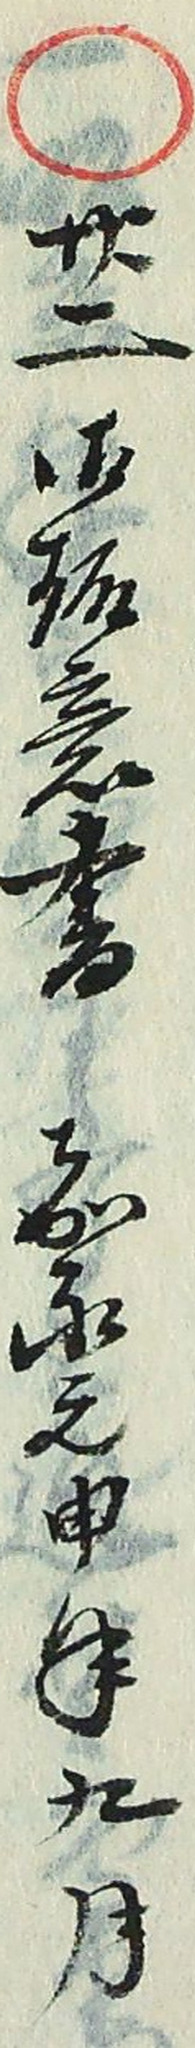○廿二御趣意書嘉永元申年九月
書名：諸御趣意書并御下知向之写
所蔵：鳴門教育大学 Naruto University of Education
